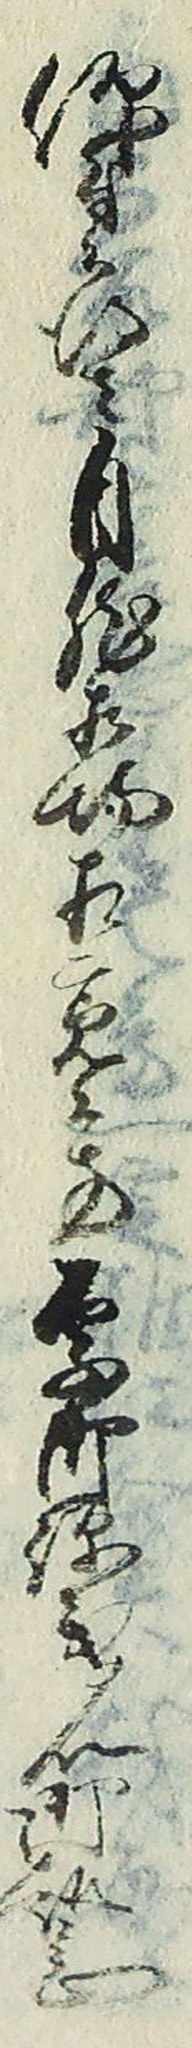仰付候得者自然相場相寛候方厚御評義ヲ以御趣意
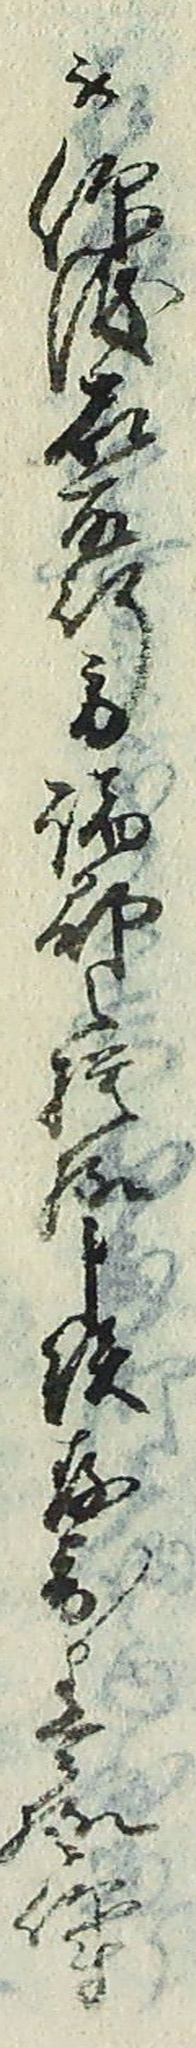被仰渡右取行方諸郡之模様申談存寄申上候様被仰付
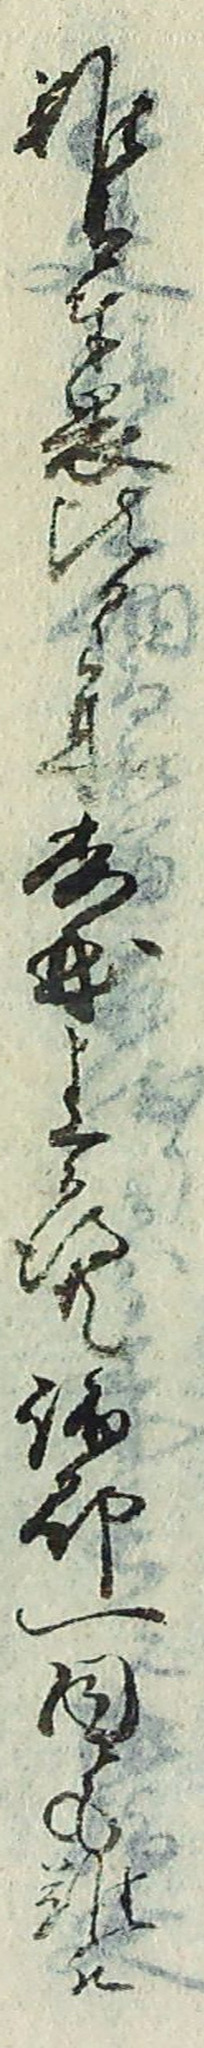難有奉畏頃日巳来委曲申上候得共諸郡一同ニも難被
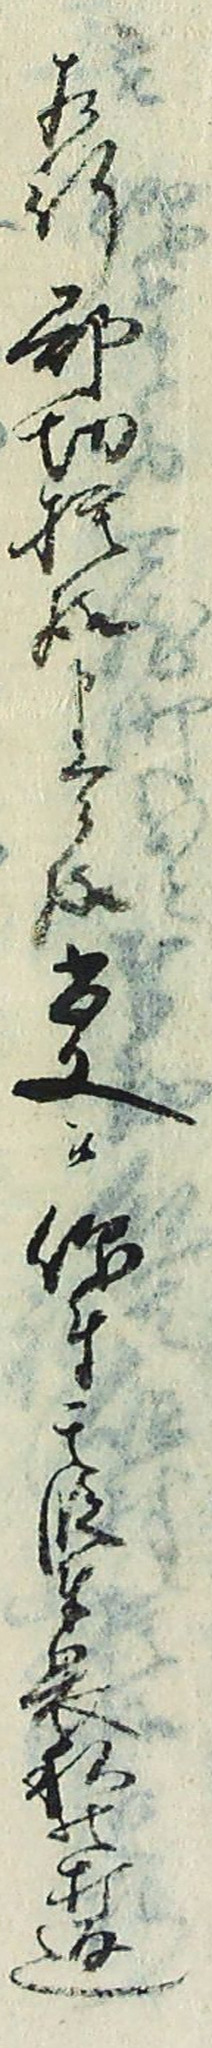相行郡切模様申上候様尚又被仰付其段奉畏私共打返
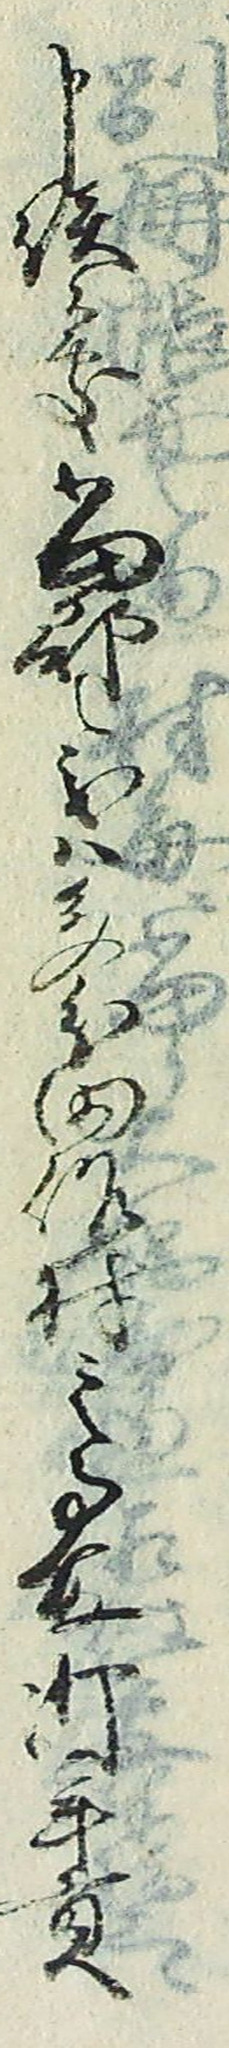申談候處當郡之義ハ多分田作村之事故御年貢
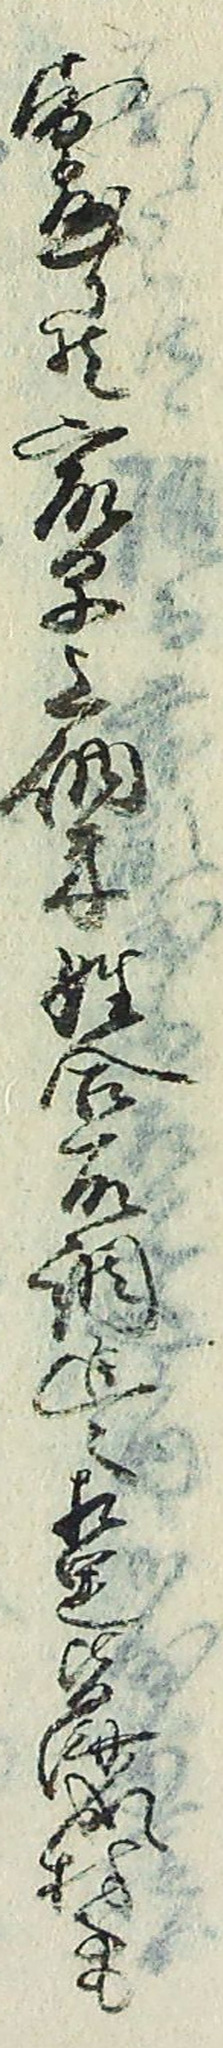歩懸り共最早上納米姓合取調追々相運皆済成候村方も
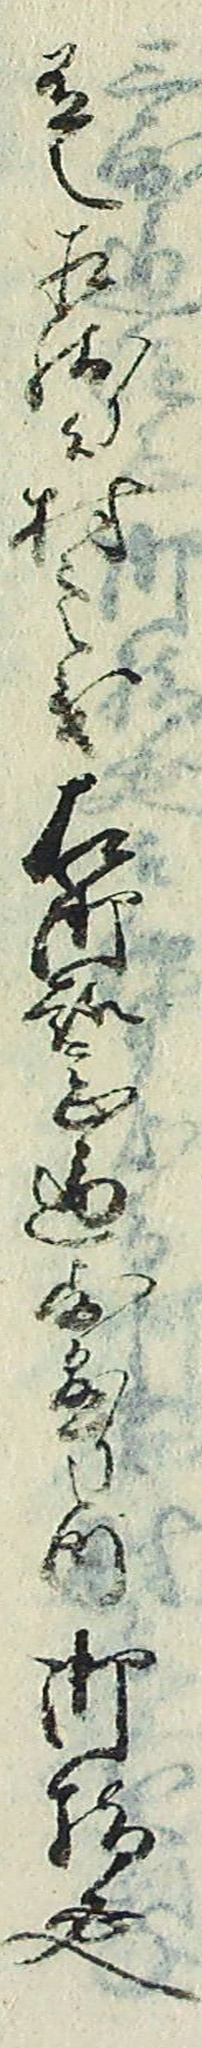有之相残り候村々之義右御趣意通歩懸り之内御指延
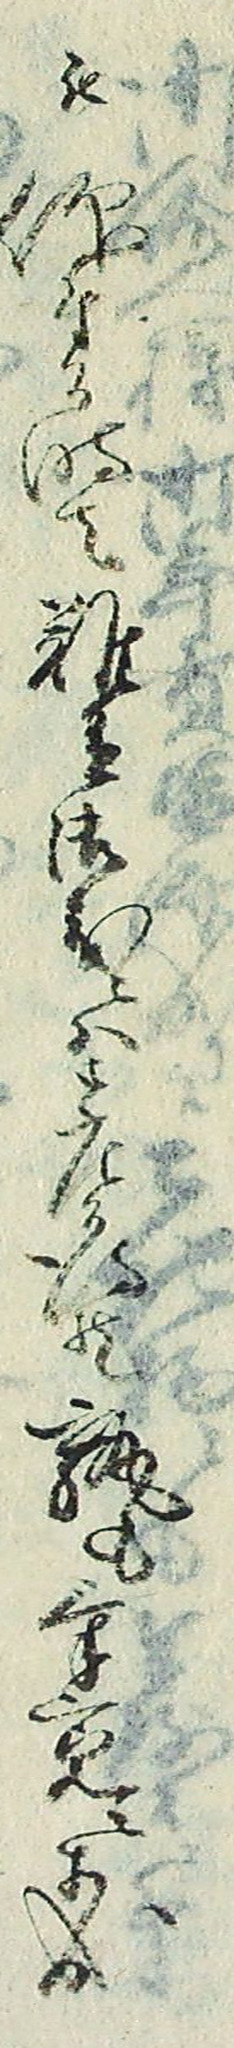被仰付候時者難有御義ニハ御座候得共孰も氣寛ニ相成
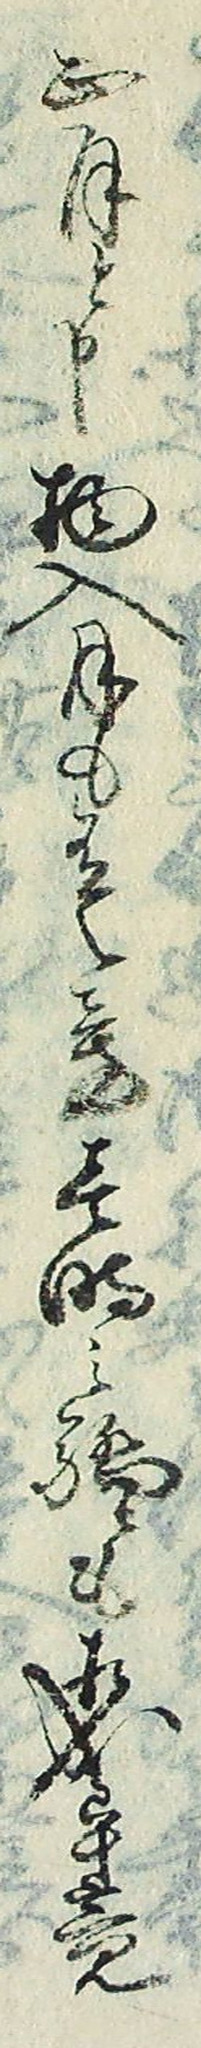正月と申物入月も有之旁壱時之驕ニも相成畢竟
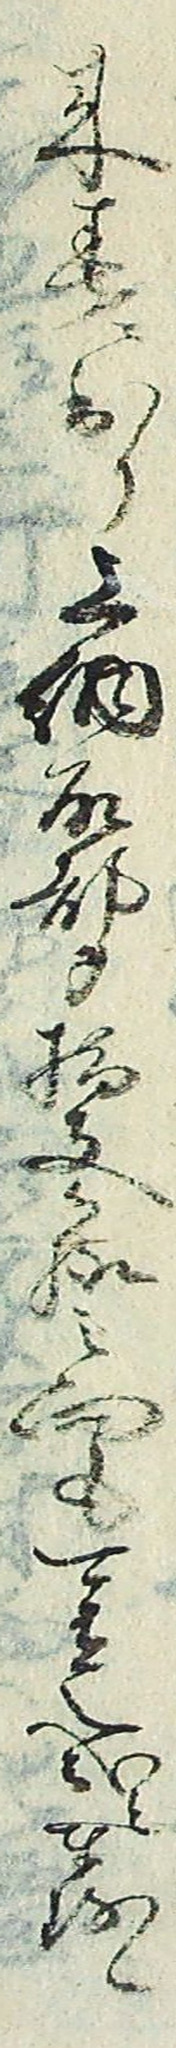来春ニ至り上納取都メ指支候様之向も可有之哉と奉存候
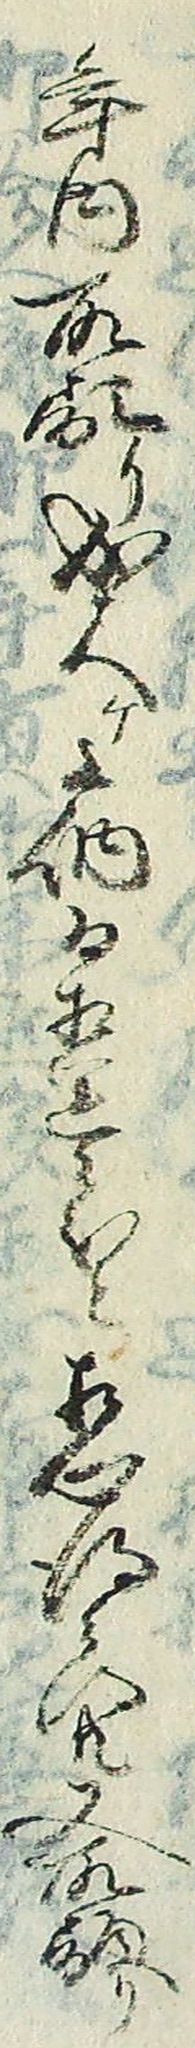年内取頻り成丈ケ上納為相運候義と相心得候得共又取頻り
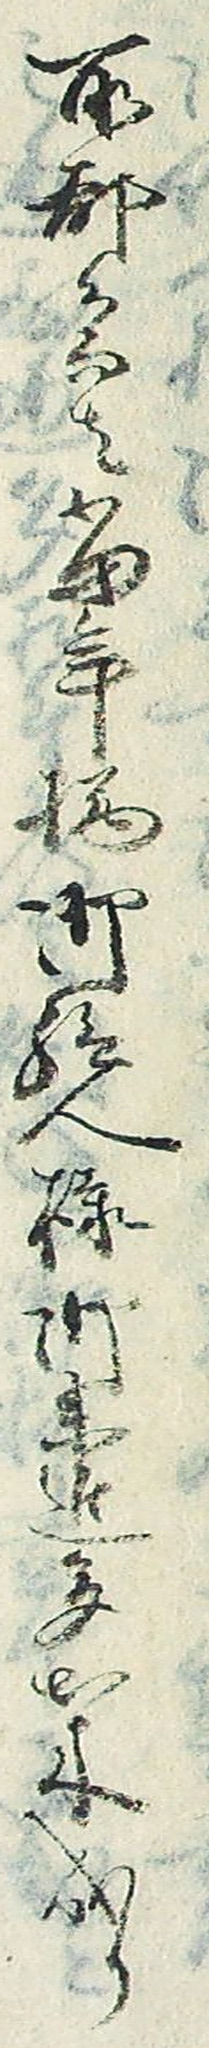取都候而者當年柄御給人様御未進多出来成り

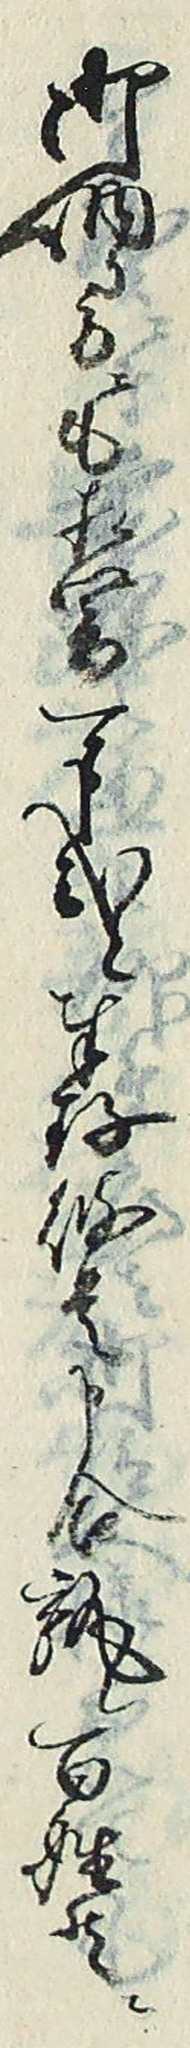御納り方ニも相響可申哉と奉存彼是申合孰レ百姓共ニ
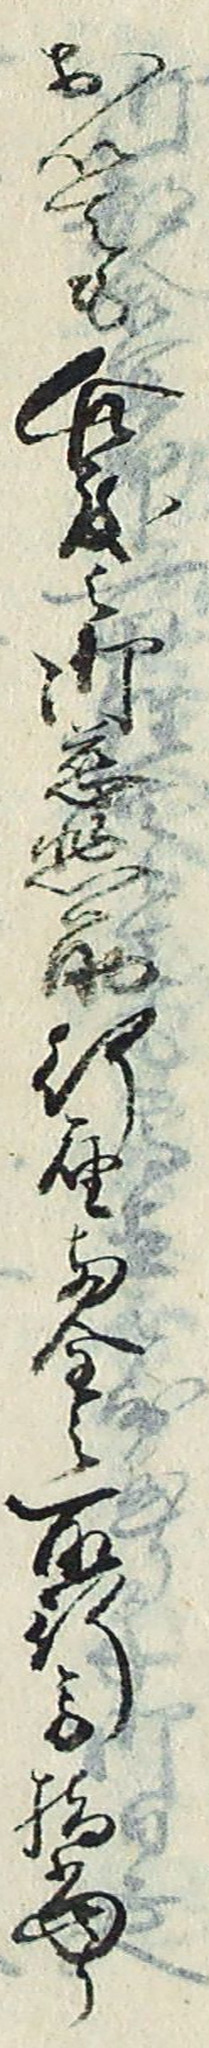おいても此度之御慈悲筋行届両全之取行方指當り
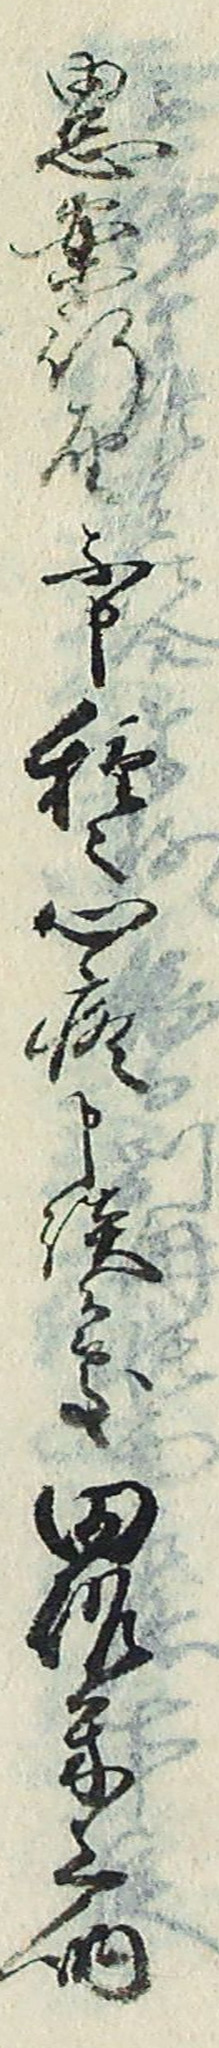思案行届不申種々心疼申談候處田作米上納
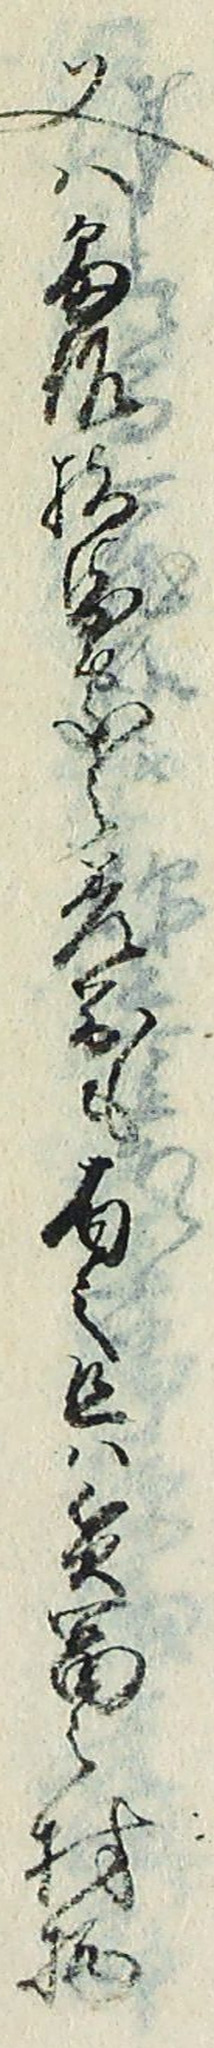又ハ畠作指帋處之差別も有之且ハ貧冨之村柄
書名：諸御趣意書并御下知向之写
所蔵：鳴門教育大学 Naruto University of Education
